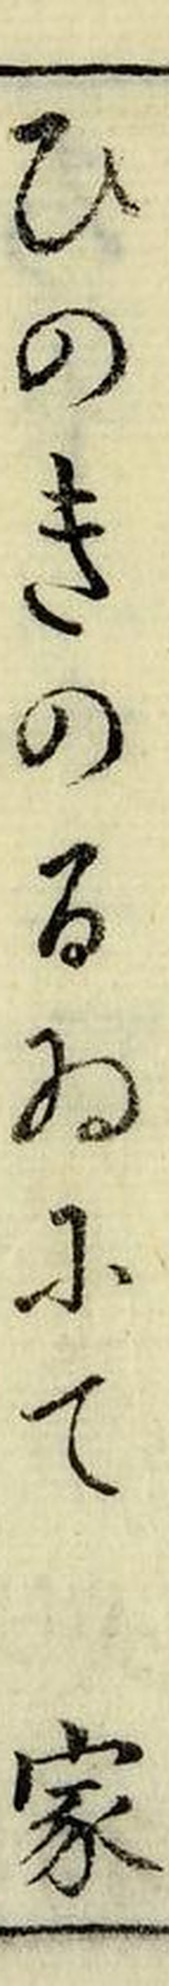ひのきのるゐにて家
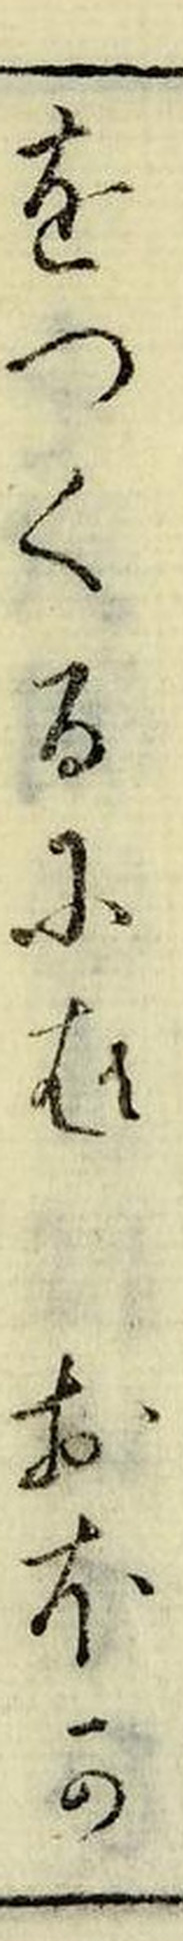をつくるにはおほか
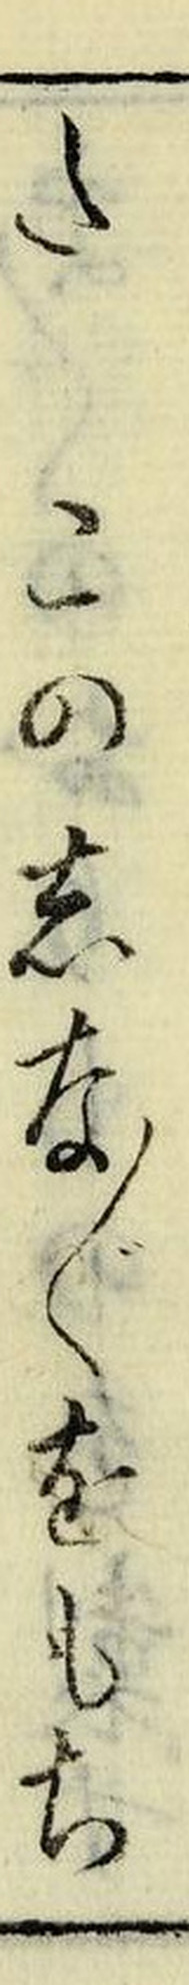たこのしな〴〵をもち
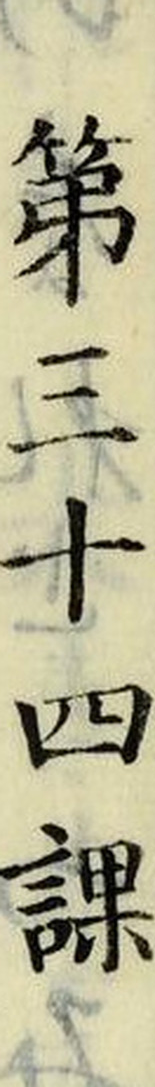第三十四課
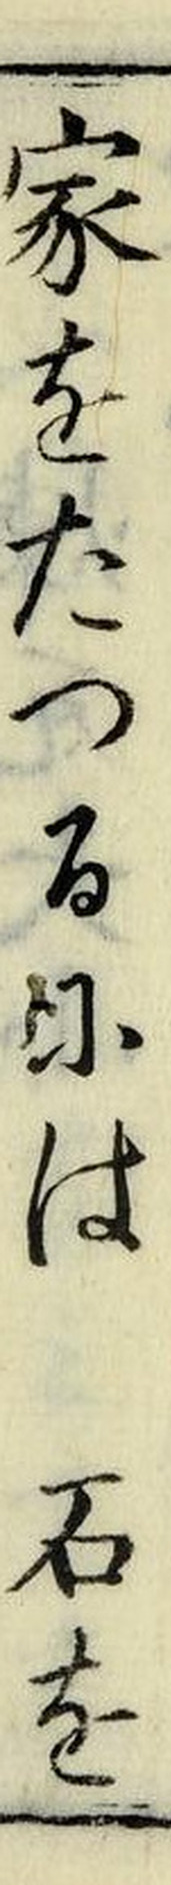家をたつるには石を
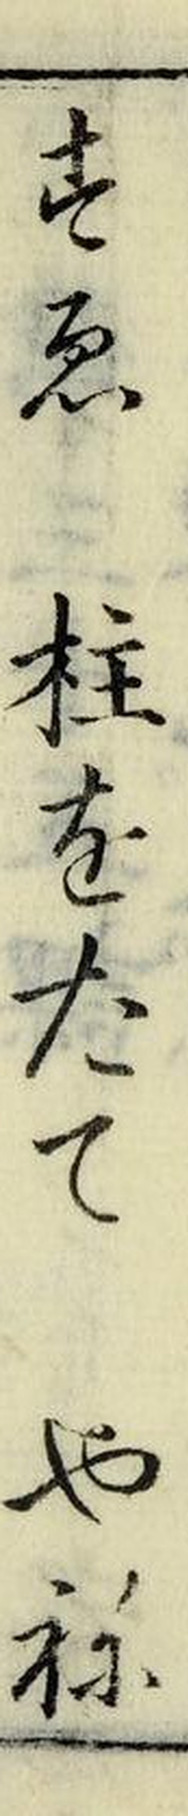すゑ柱をたてやね
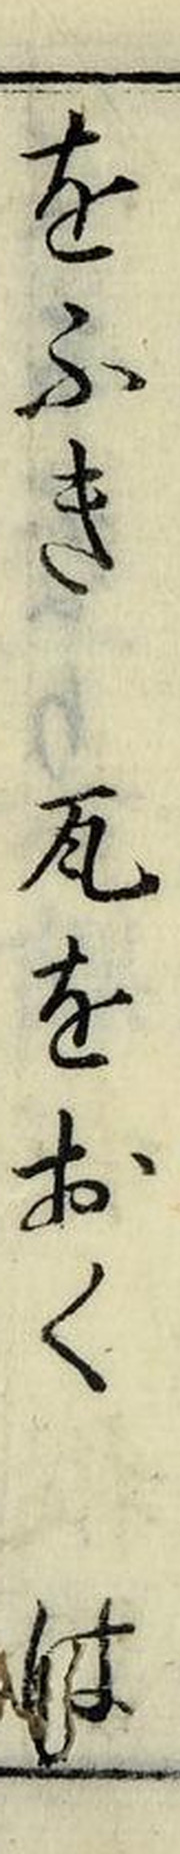をふき瓦をおくは
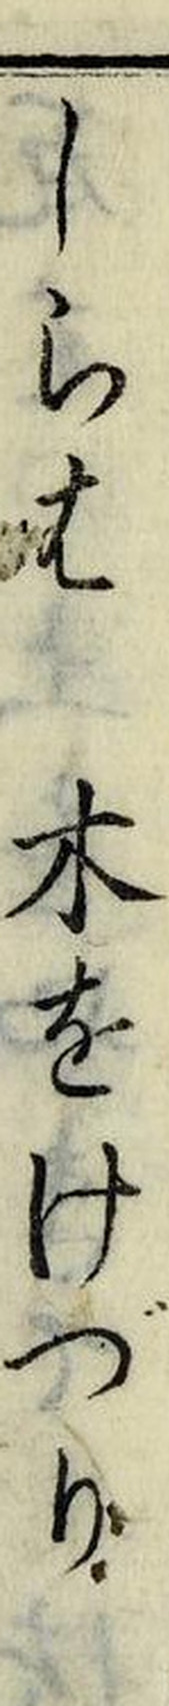しらは木をけづり

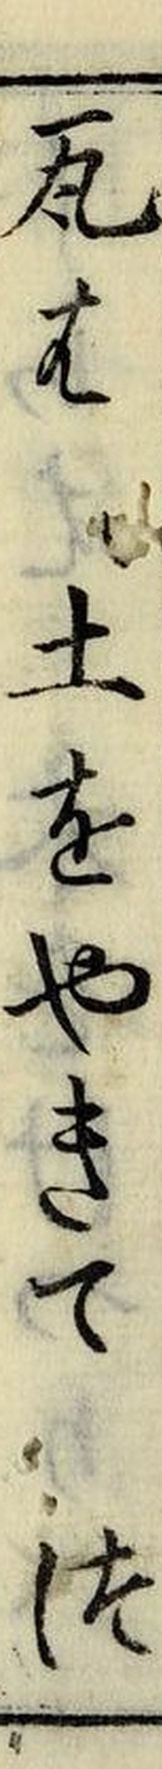瓦は土をやきてつ
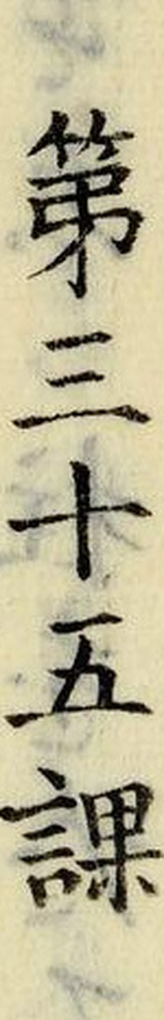第三十五課
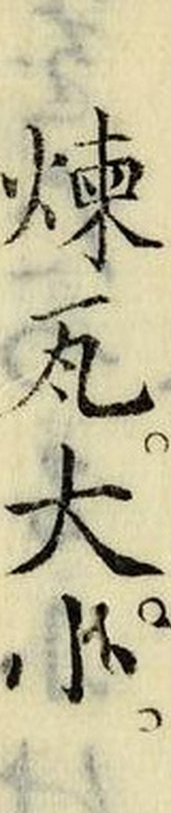煉瓦。大。小。
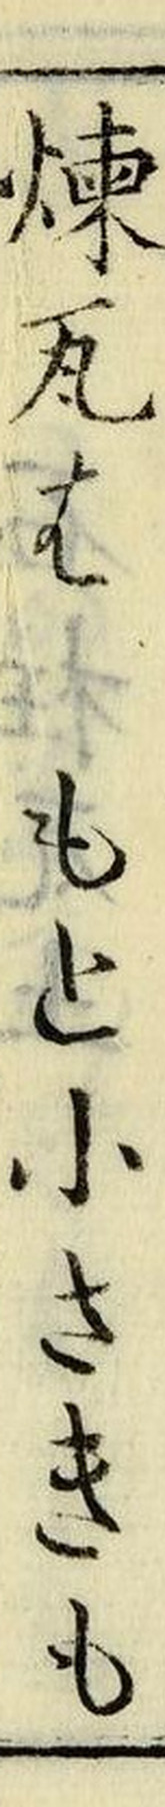煉瓦はもと小さきも
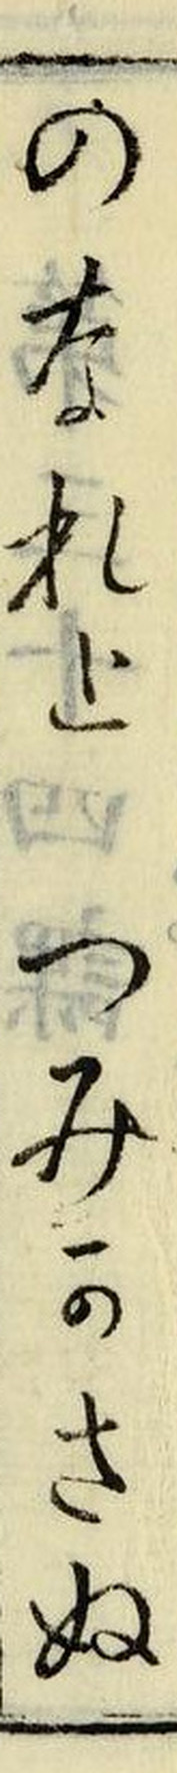のなれとつみかさぬ
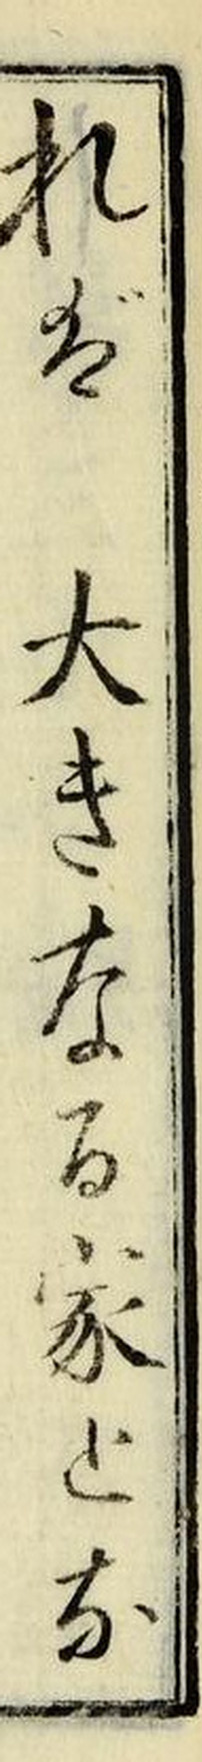れば大きなる家とな
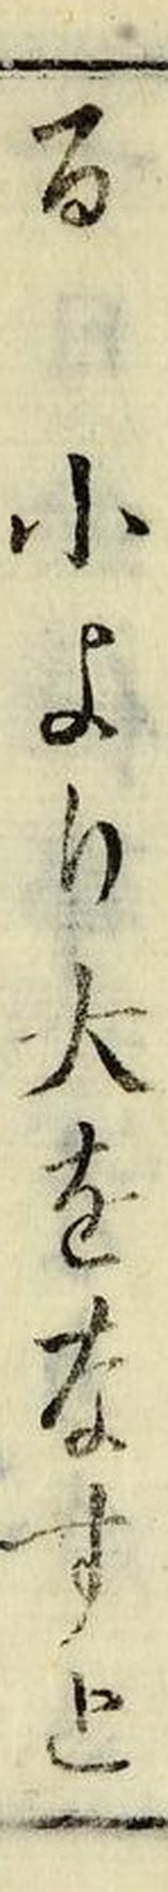る小より大をなすと
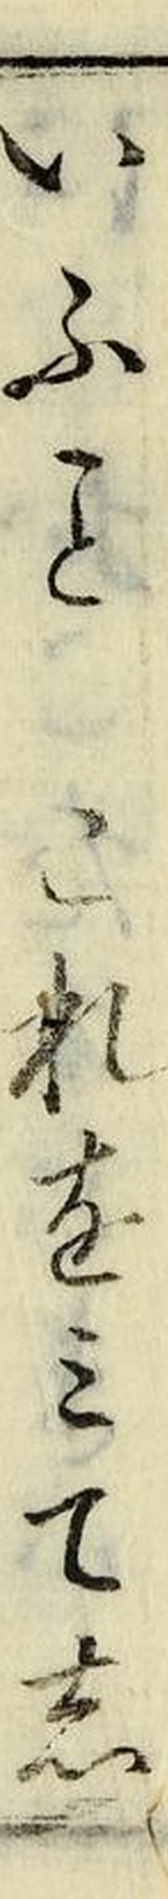いふことこれをみてし
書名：小学読本 初等科 巻一
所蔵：福井県文書館 Fukui Prefectural Archives
